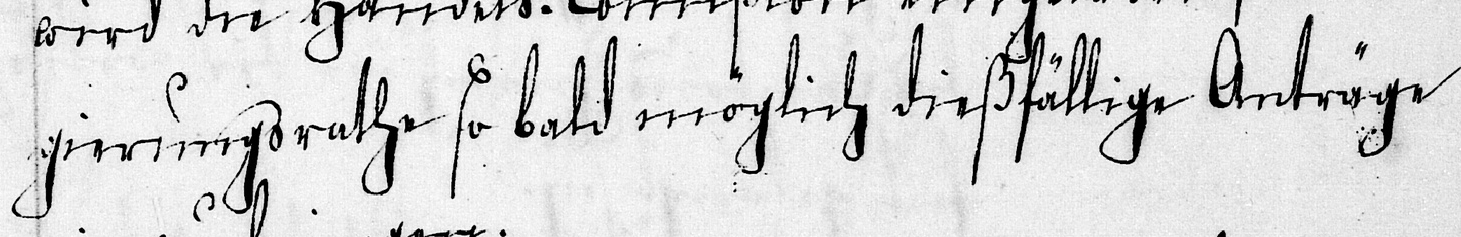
gierungsrath so bald möglich dießfällige Anträge
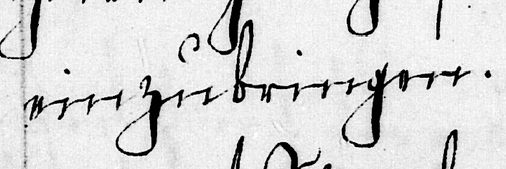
einzubringen.
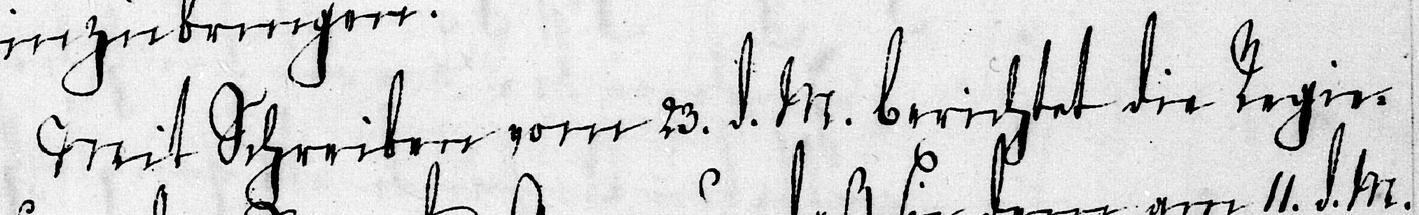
Mit Schreiben vom 23. d. M. berichtet die Regie¬
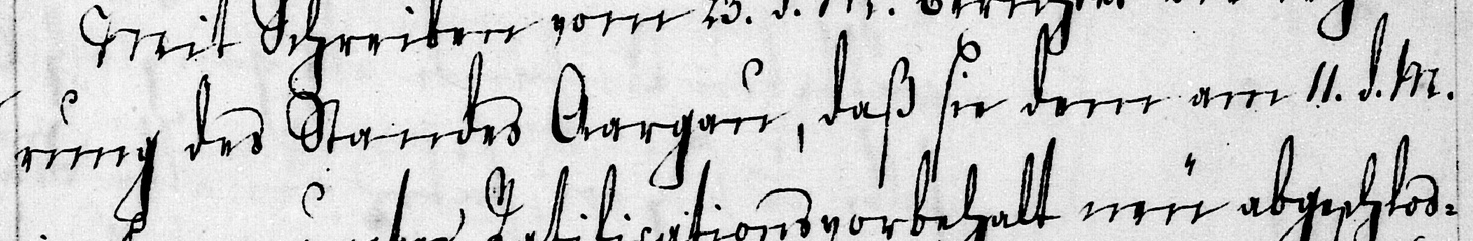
rung des Standes Aargau, daß sie dem am 11. d. M.
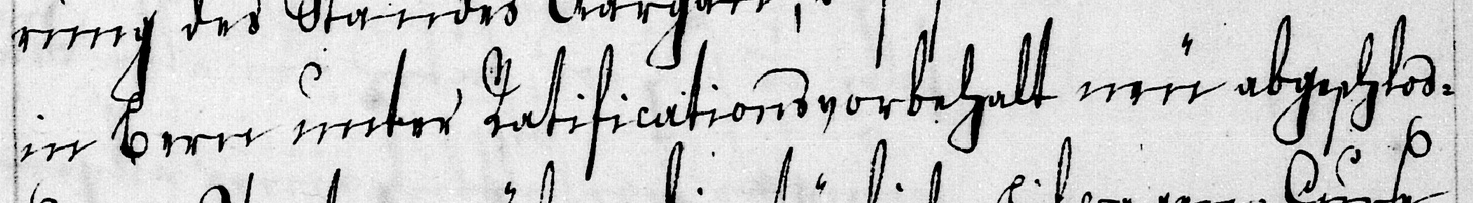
in Bern unter Ratificationsvorbehalt neu abgeschloß¬
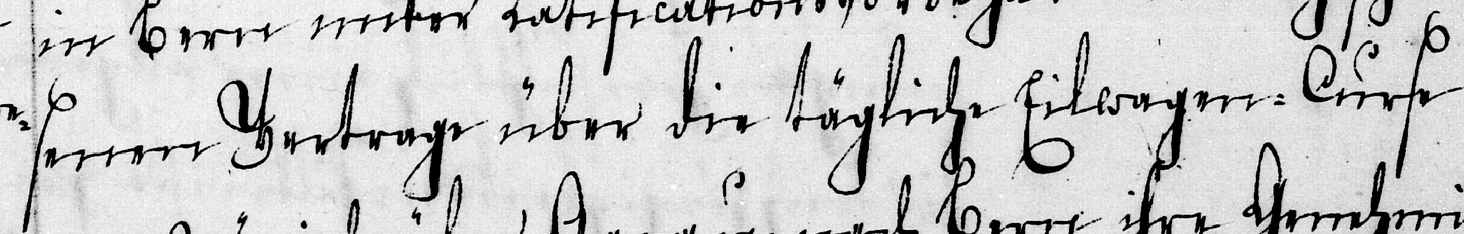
enen Vertrage über die tägliche Eilwagen-Curse
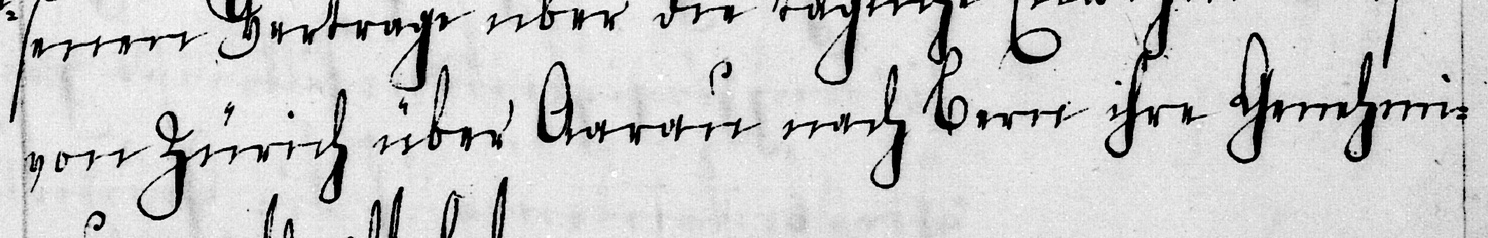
von Zürich über Aarau nach Bern ihre Genehmi¬
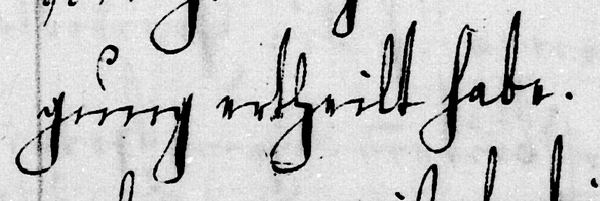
gung ertheilt habe.
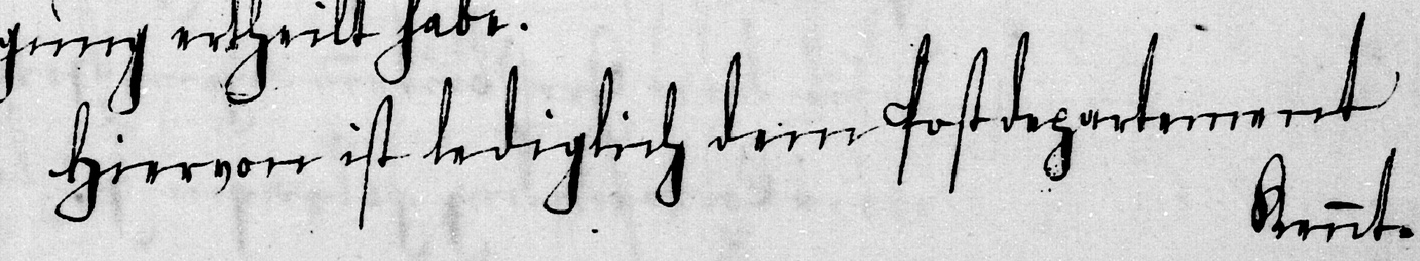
Hiervon ist lediglich dem Postdepartement
